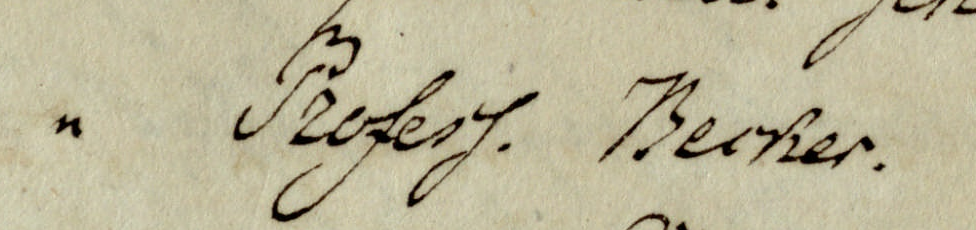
Profess. Becker.
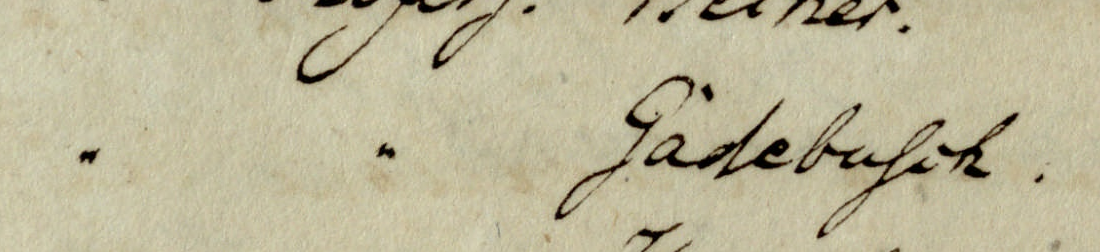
Gadebusch.
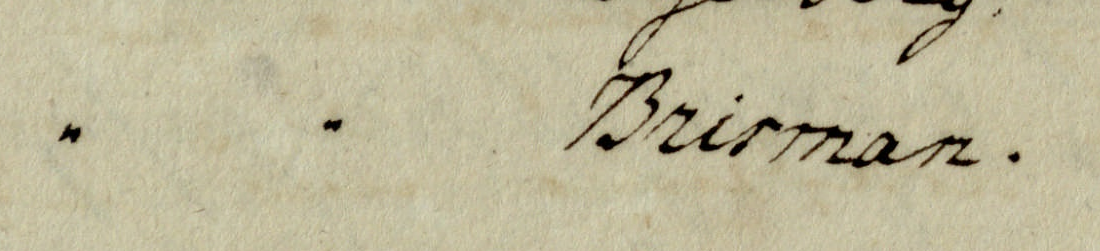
Brisman.
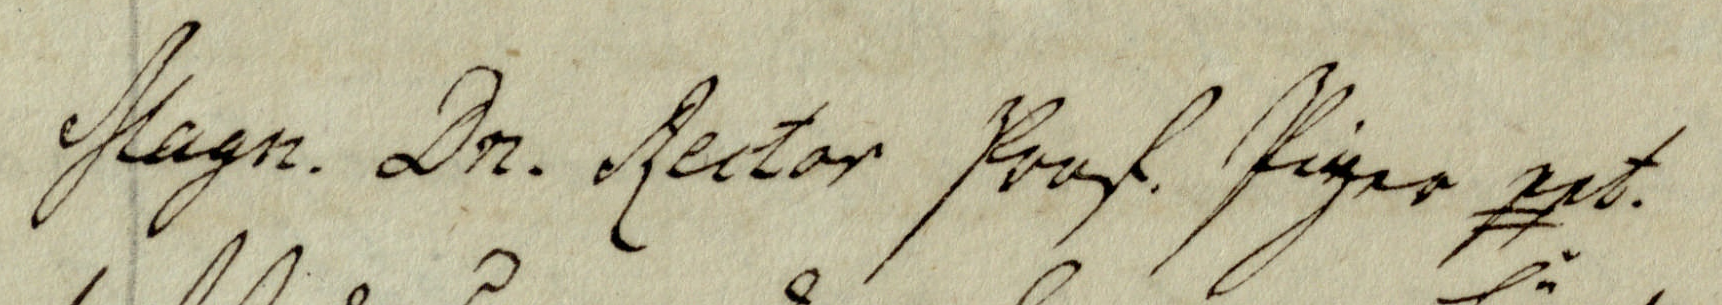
Magn. Dn. Rector Prof. Piper ppt.
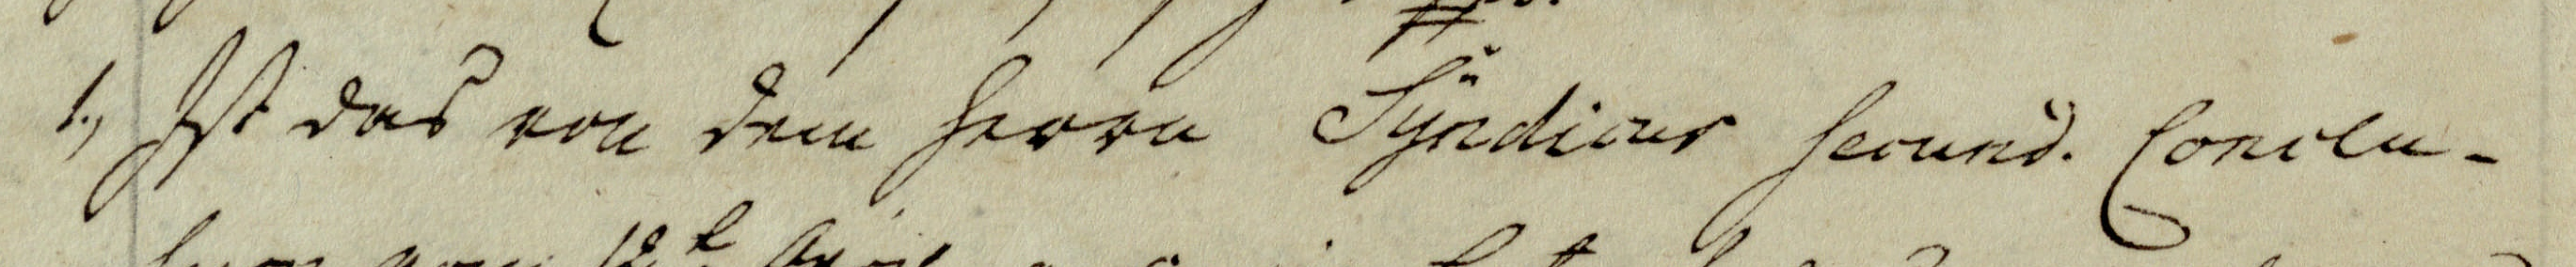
1, Ist das von dem Herrn Sÿndicus secund. Conclu¬
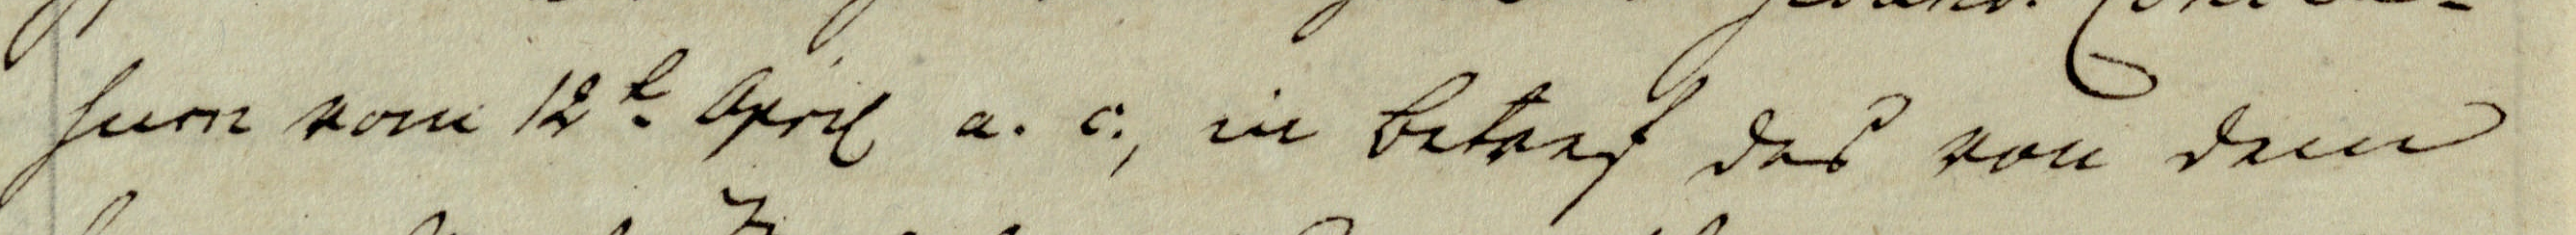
sum vom 12 t. April a. c., in Betref des von dem
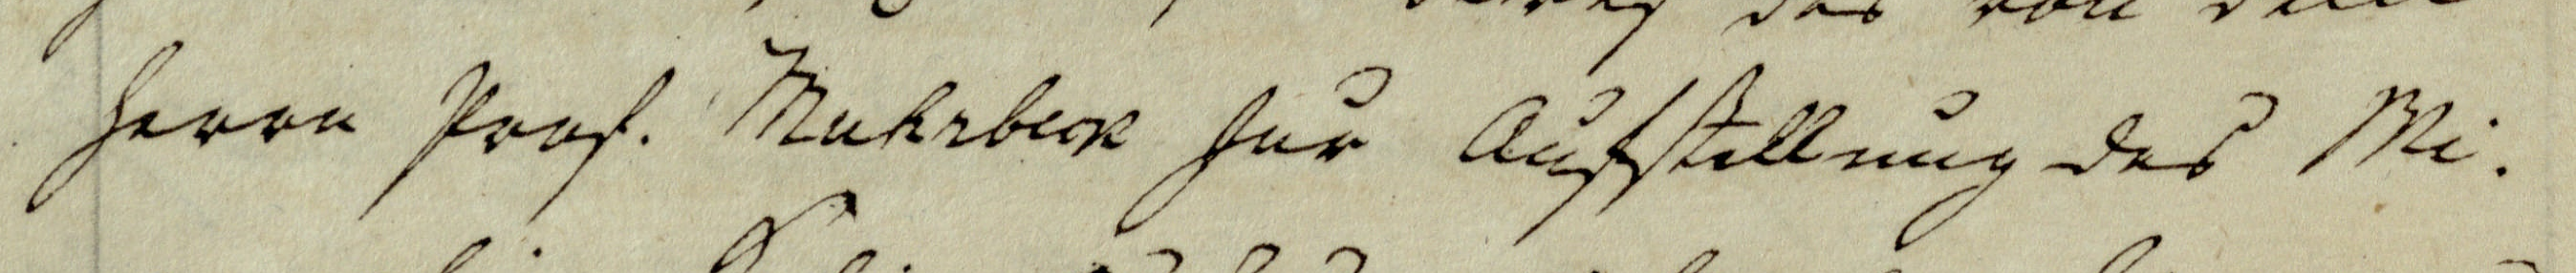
Herrn Prof. Muhrbeck zur Aufstellung des Mi¬
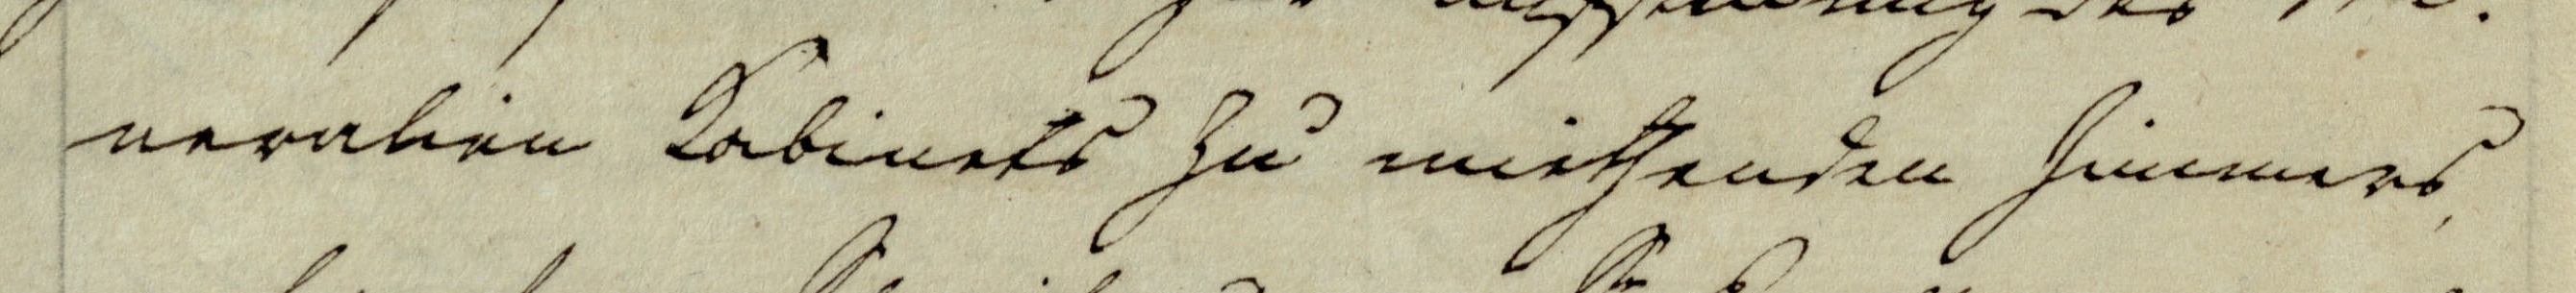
neralien Cabinets zu miethenden Zimmers
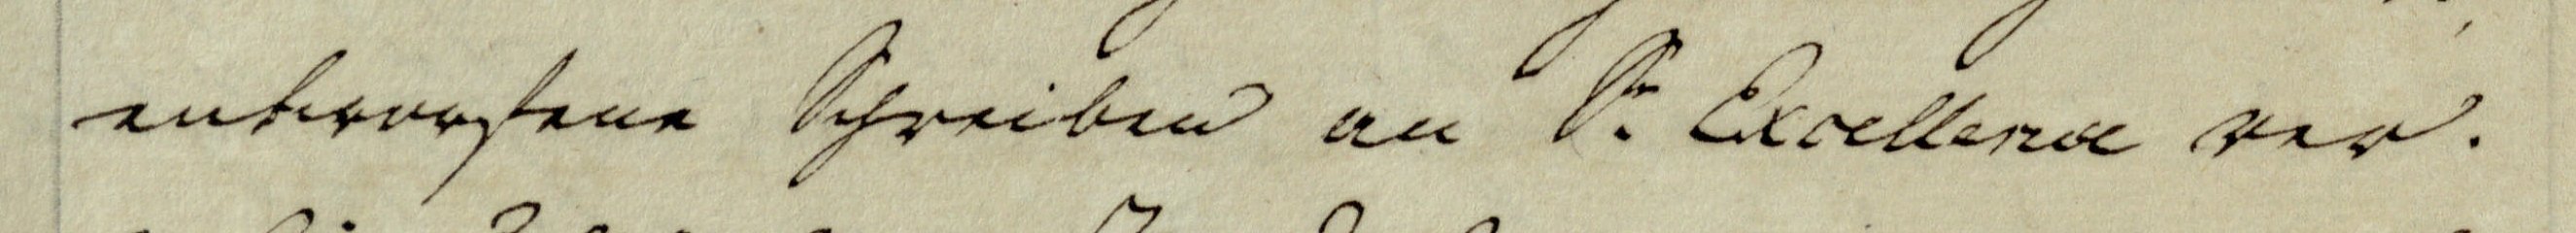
entworfene Schreiben an Sr. Excellence ver¬
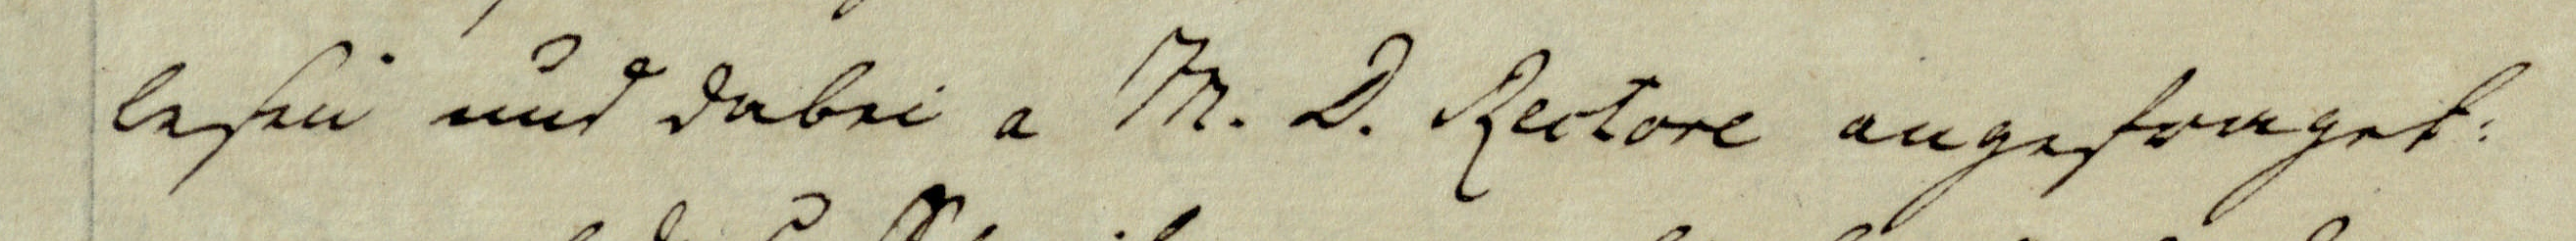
lesen und dabei a M. D. Rectore angefraget:
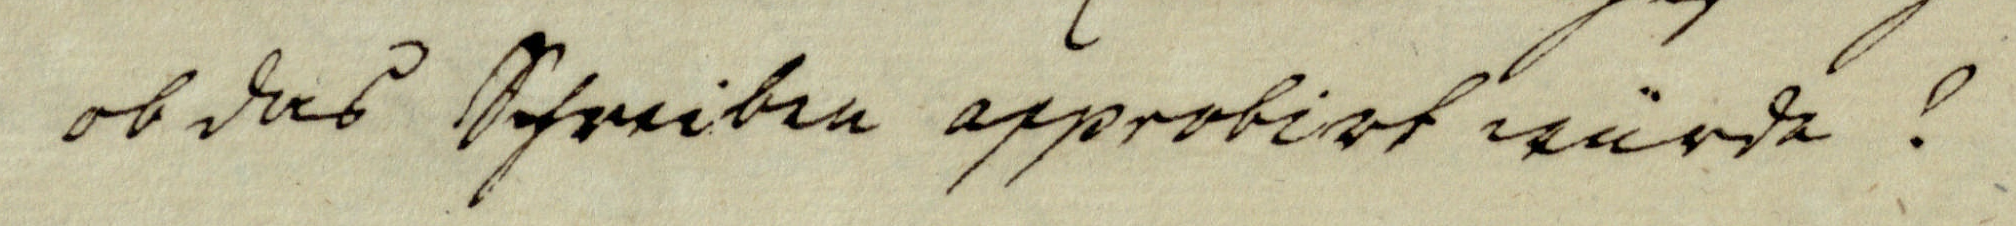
ob das Schreiben approbirt würde?
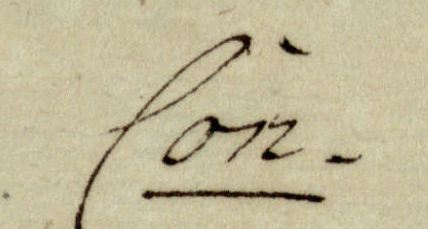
Con¬
